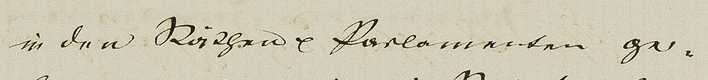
in den Räthen & Parlamenten ge-
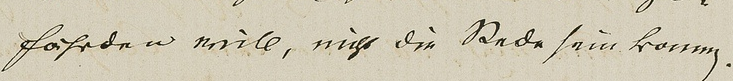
fährden will, nicht die Rede sein kann.
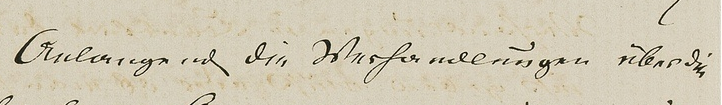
Anlangend die Verhandlungen über die
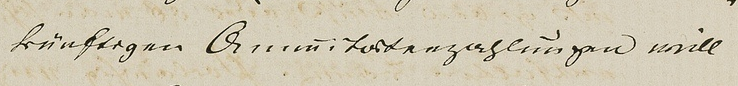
künftigen Annuitätenzahlungen will
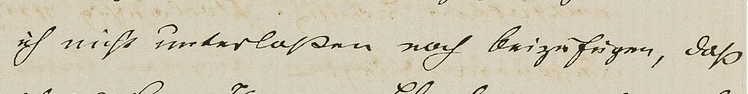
ich nicht unterlaßen noch beizufügen, daß
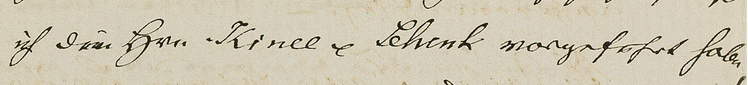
ich den Hrn. Kinel & Schenk vorgeführt habe,
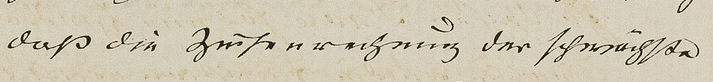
daß die Zinsenrechnung des schwächsten
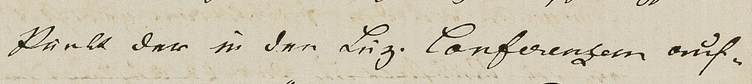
Punkt der in den Luz. Conferenzen auf-
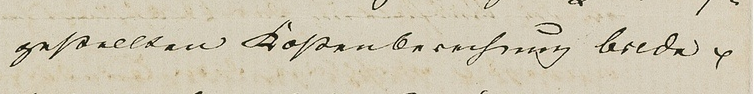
gestellten Kostenberechnung bilde &
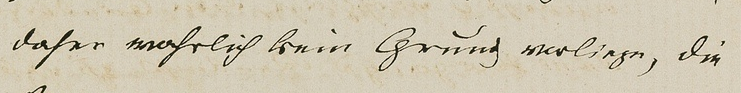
daher wahrlich kein Grund vorliege, die
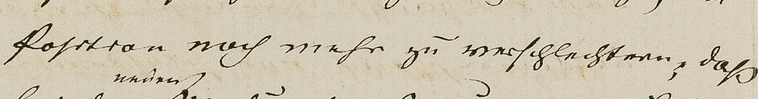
Position noch mehr zu verschlechtern, daß
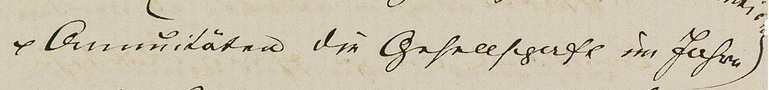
& Annuitäten die Gesellschaft im Jahre
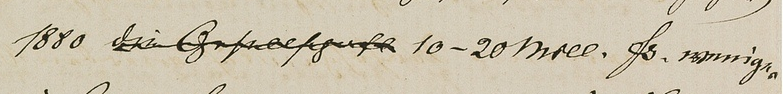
1880 die Gesellschaft 10–20 Mill. fs. weniger
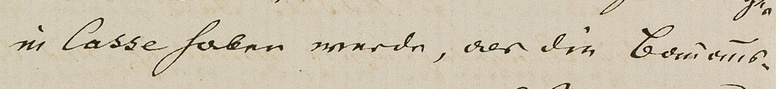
in Casse haben werde, als die Bauaus-
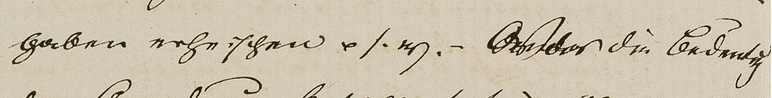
gaben erheischen &s. w. – Was das die Bedeutung
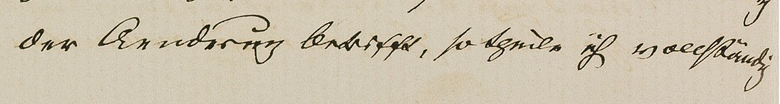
der Aenderung betrifft, so theile ich vollständig
